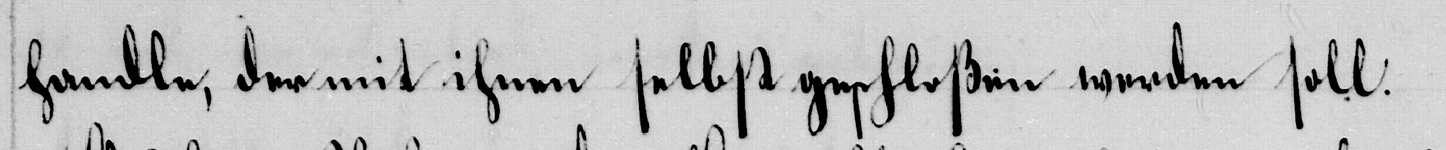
handle, der mit ihnen selbst geschloßen werden soll.
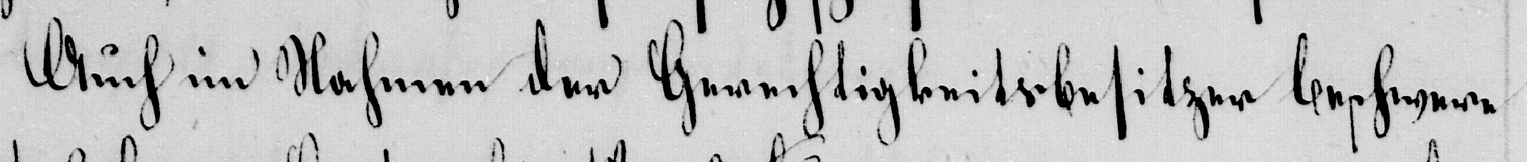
Auch im Nahmen der Gerechtigkeitsbesitzer beschwere
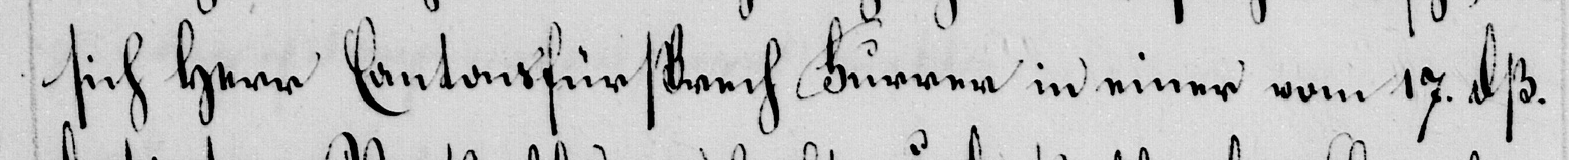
sich Herr Cantonsfürsprech Furrer in einer vom 17. dß.
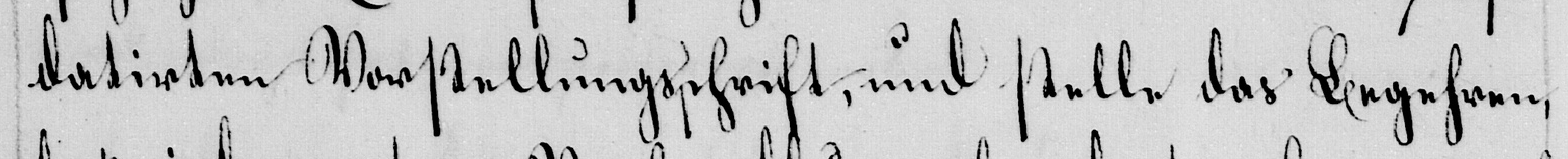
datirten Vorstellungsschrift, und stelle das Begehren,
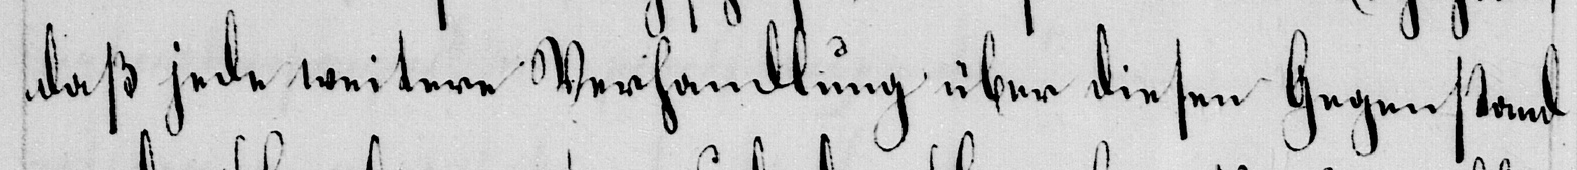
daß jede weitere Verhandlung über diesen Gegenstand
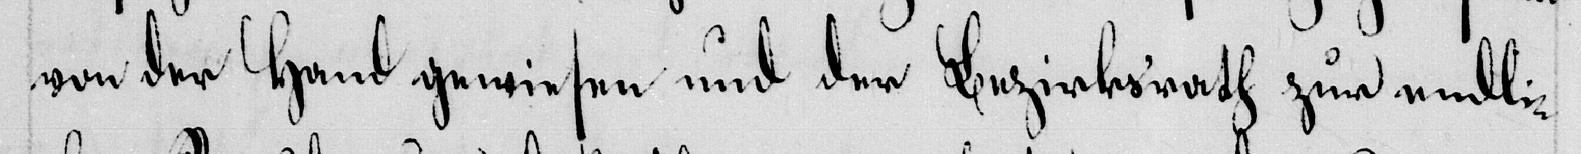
von der Hand gewiesen und der Bezirksrath zur endli¬
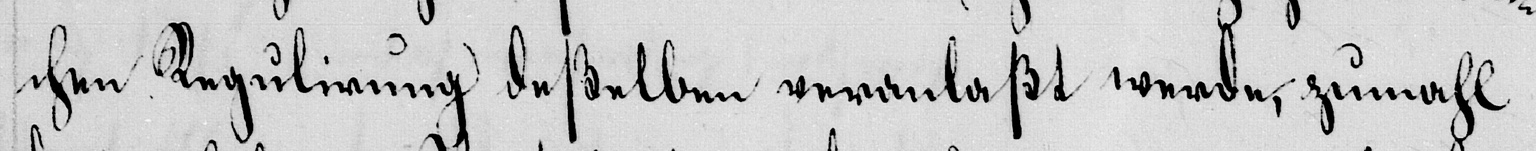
chen Regulirung deßelben veranlaßt werde, zumahl
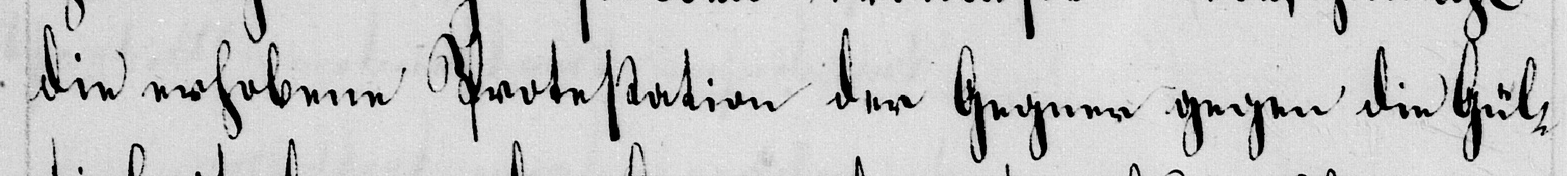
die erhobene Protestation der Gegner gegen die Gül¬
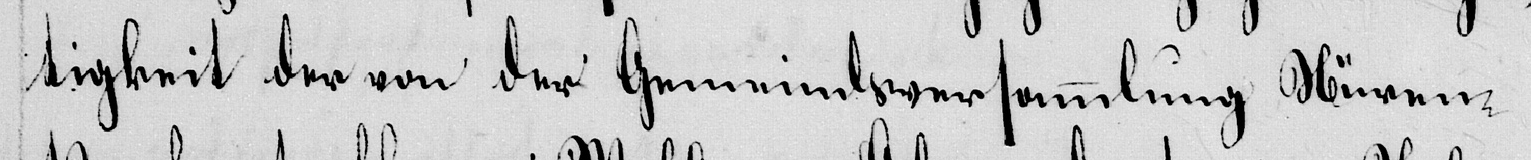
tigkeit der von der Gemeindsversammlung Nüren¬
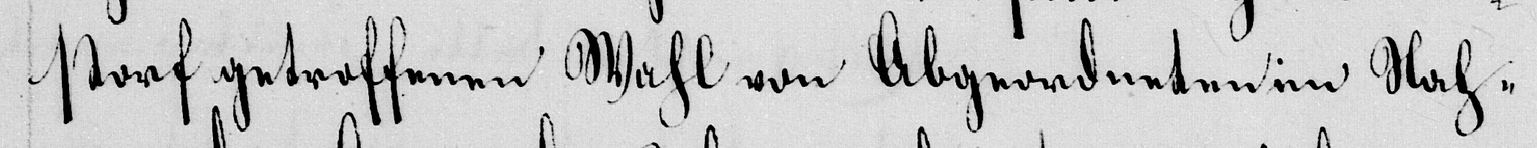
storf getroffenen Wahl von Abgeordneten im Nah¬
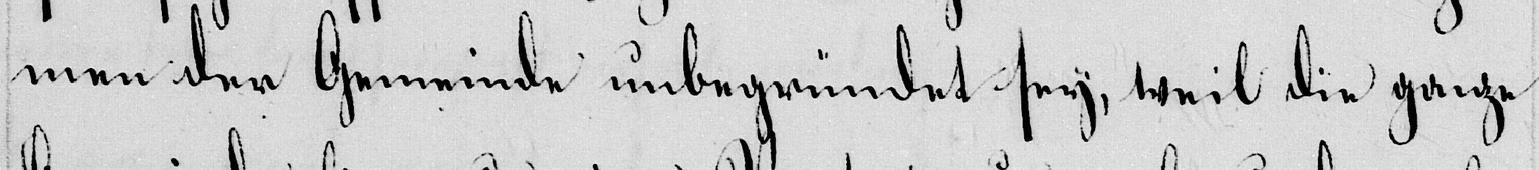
men der Gemeinde unbegründet sey, weil die ganze
